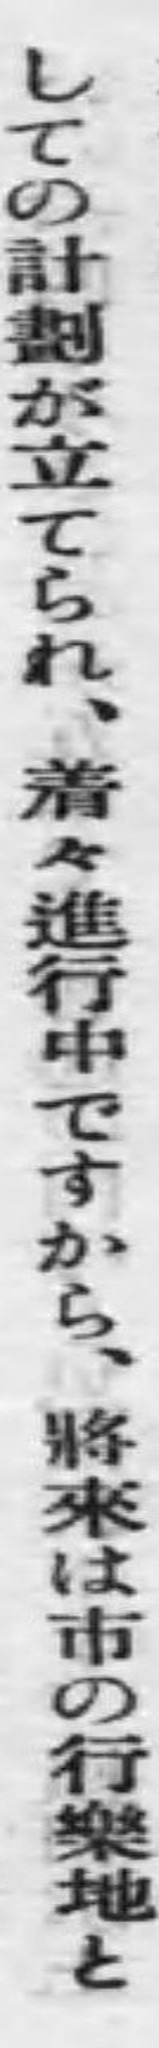しての計画が立てられ、着々進行中ですから、将来は市の行楽地と
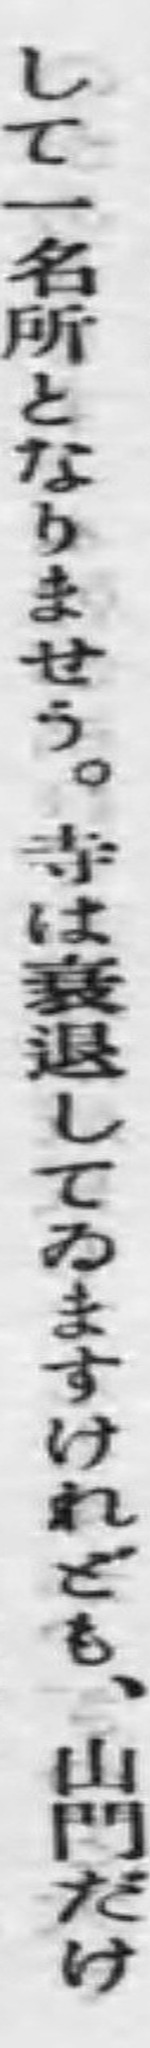して一名所となりませう。寺は衰退してゐますけれども、山門だけ
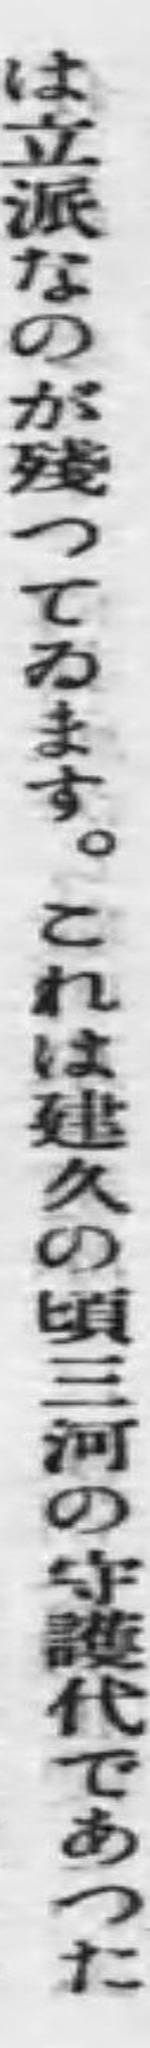は立派なのが残つてゐます。これは建久の頃三河の守護代であつた
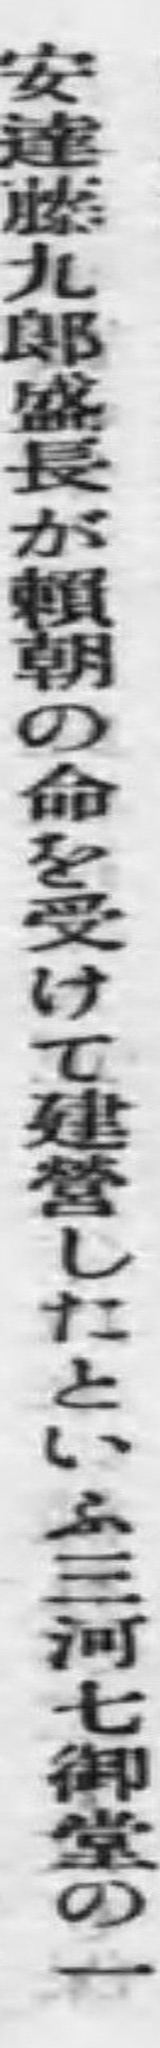安達藤九郎盛長が頼朝の命を受けて建営したといふ三河七御堂の一
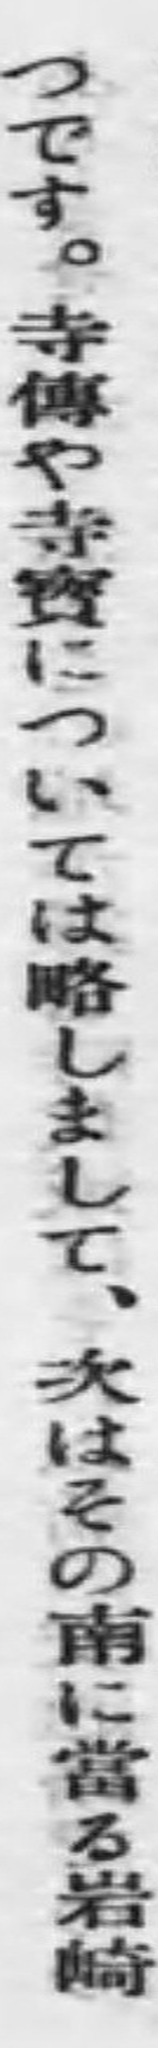つです。寺伝や寺宝については略しまして、次はその南に当る岩崎
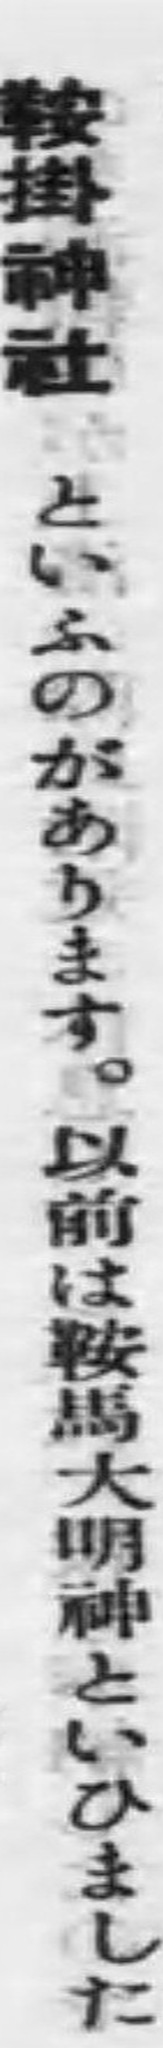鞍掛神社といふのがあります。以前は鞍馬大明神といひました

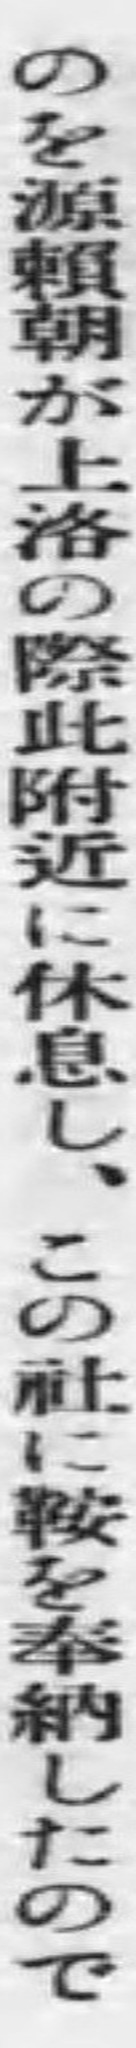のを源頼朝が上洛の際此附近に休息し、この社に鞍を奉納したので
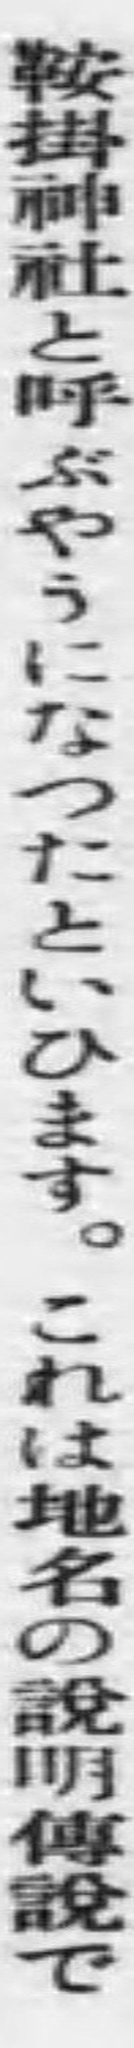鞍掛神社と呼ぶやうになつたといひます。これは地名の説明伝説で
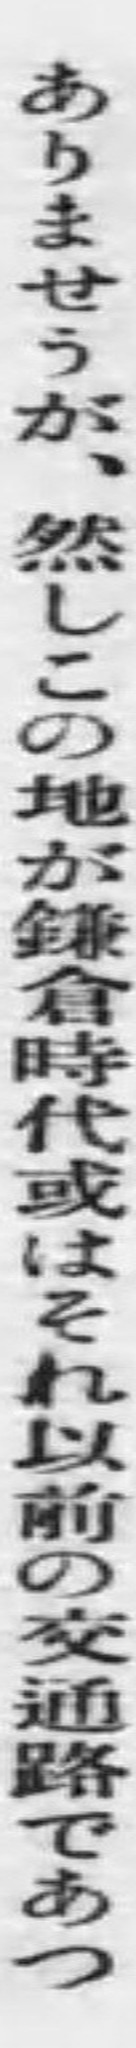ありませうが、然しこの地が鎌倉時代或はそれ以前の交通路であつ
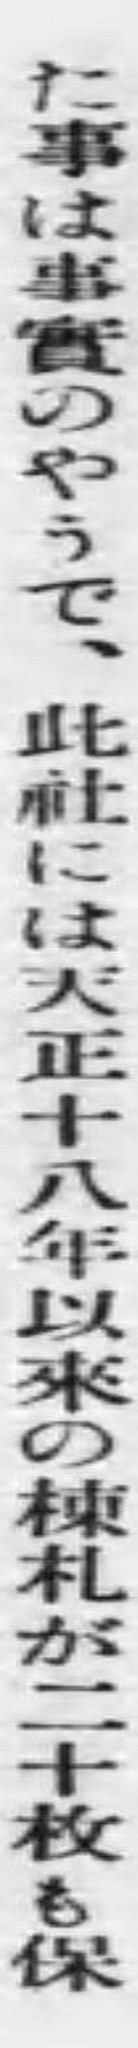た事は事実のやうで、此社には天正十八年以来の棟札が二十枚も保
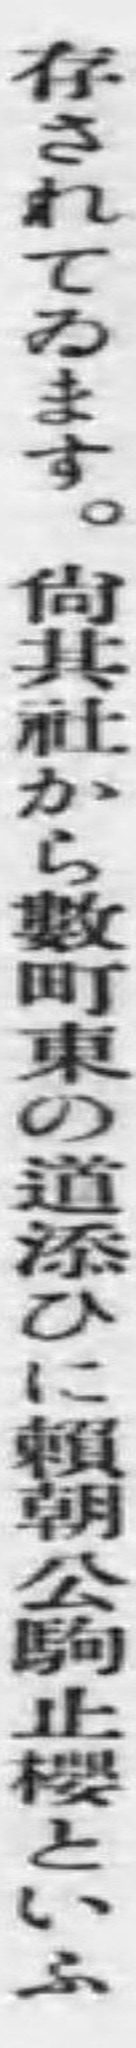存されてゐます。尚其社から数町東の道添ひに頼朝公駒止桜といふ
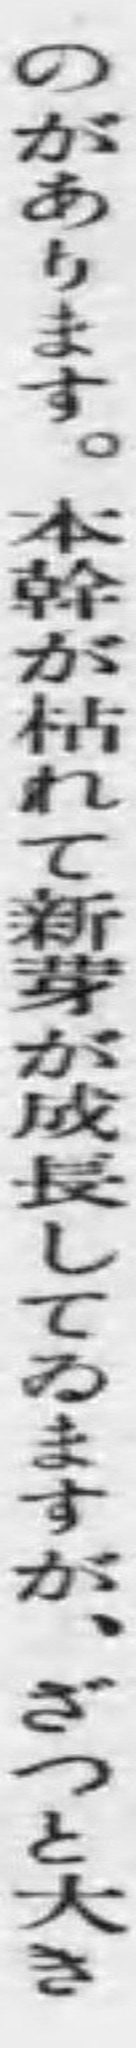のがあります。本幹が枯れて新芽が成長してゐますが、ざつと大き
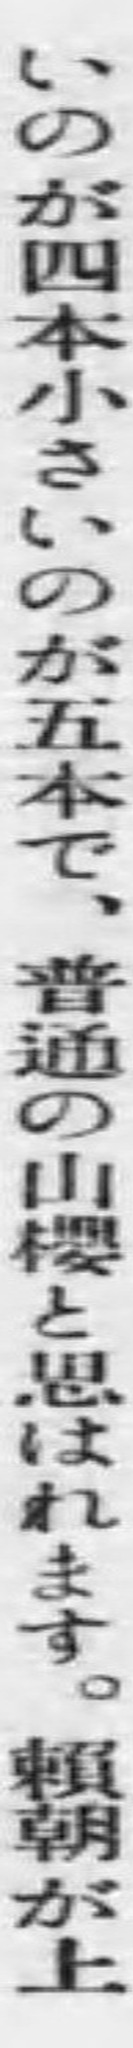いのが四本小さいのが五本で、普通の山桜と思はれます。頼朝が上
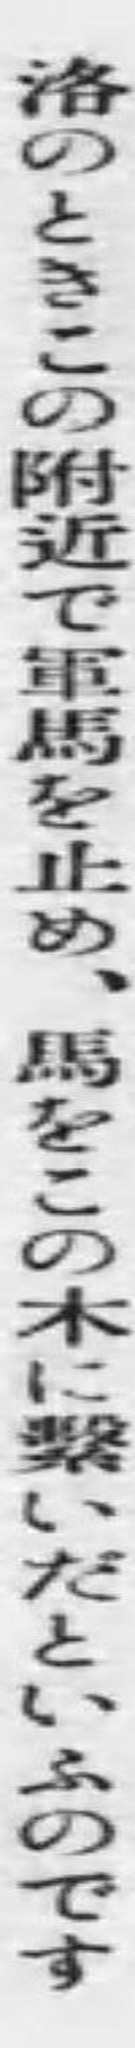洛のときこの附近で軍馬を止め、馬をこの木に繋いだといふのです
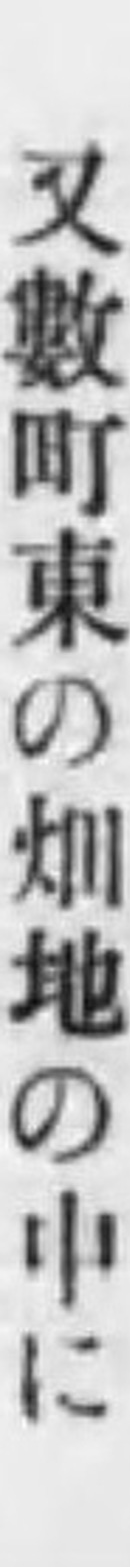又数町東の畑地の中に
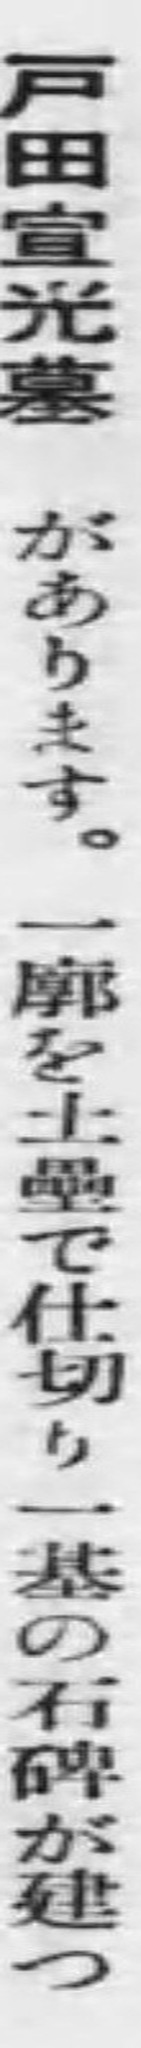戸田宣光墓があります。一廓を土塁で仕切り一基の石碑が建つ
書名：東三河道中記 : 豊橋市及其附近案内
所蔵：国立国会図書館 National Diet Library, JAPAN
